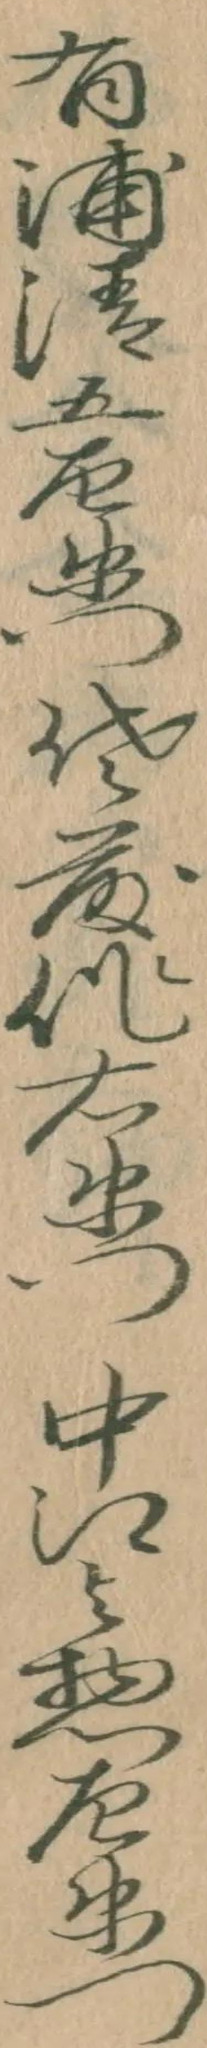有浦清五左衛門佐藤作右衛門中江与惣左衛門
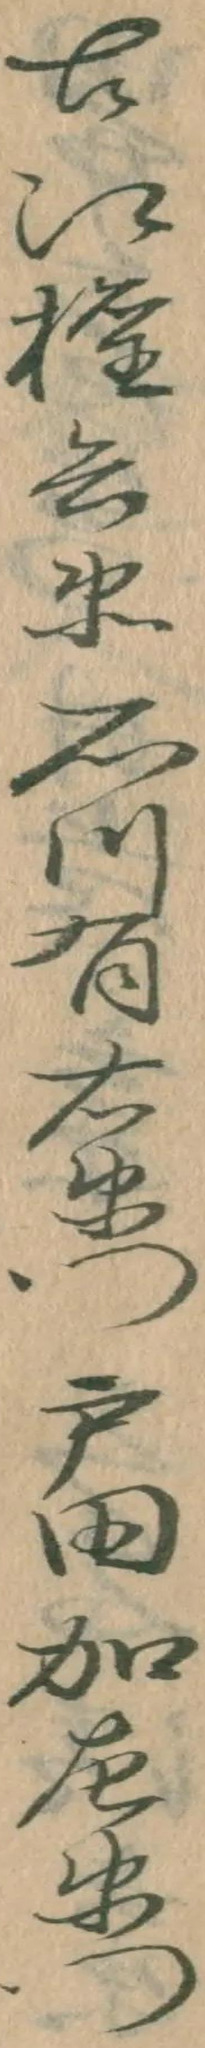古江権兵衛石川有右衛門戸田加左衛門
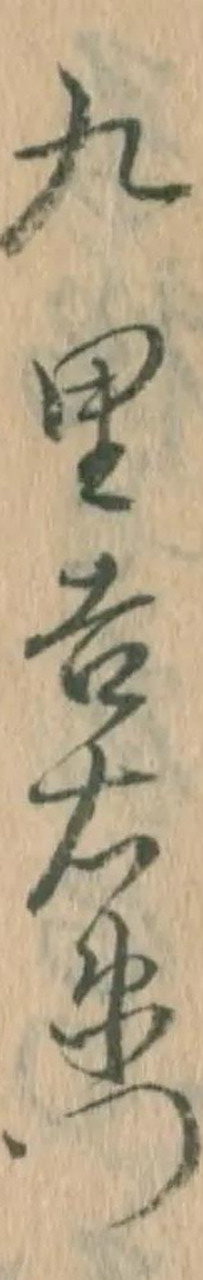九里吉右衛門
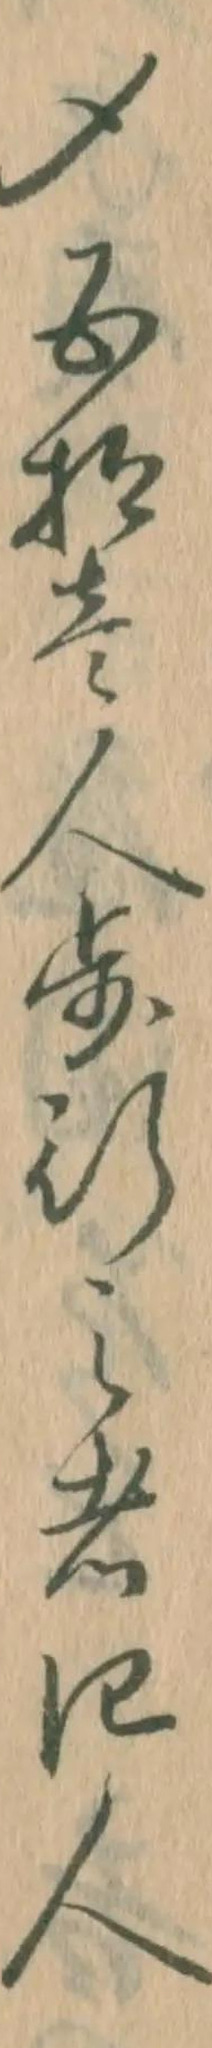〆五拾壱人歩行之者四人

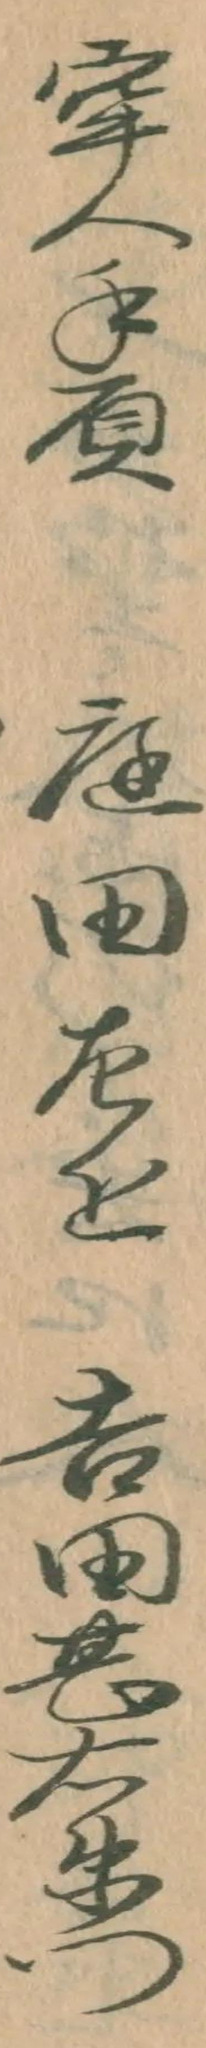牢人手負庭田佐近吉田甚右衛門
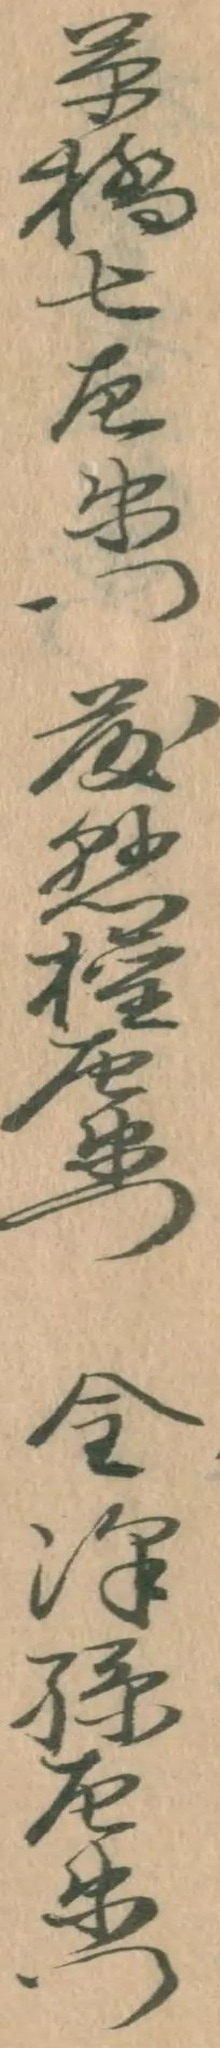草橋七左衛門藤惣権左衛門金津孫左衛門
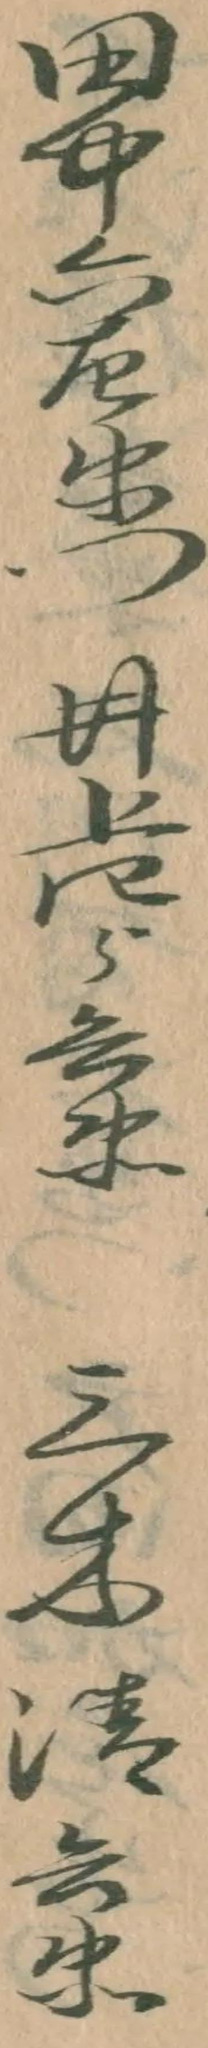田中六左衛門井上四郎兵衛三木清兵衛
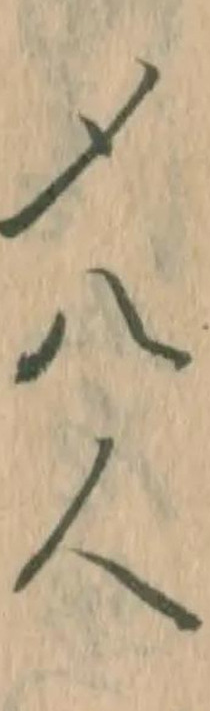〆八人
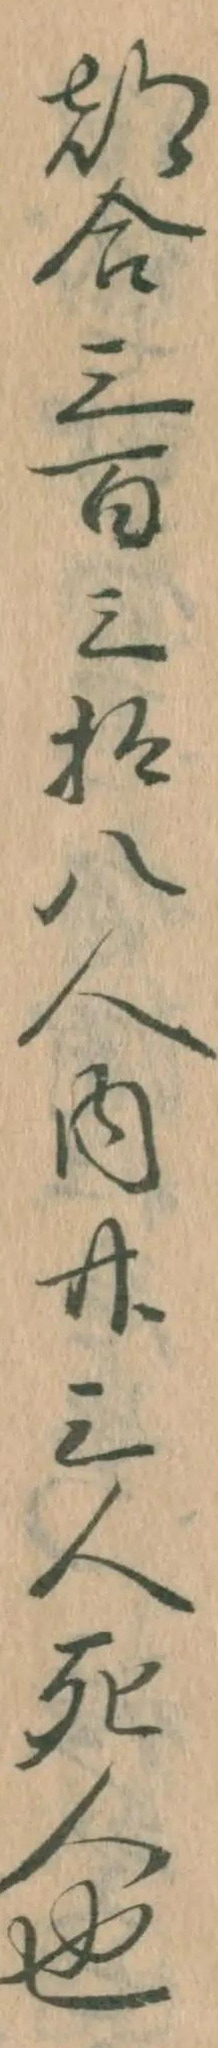都合三百三拾八人内廿三人死人也
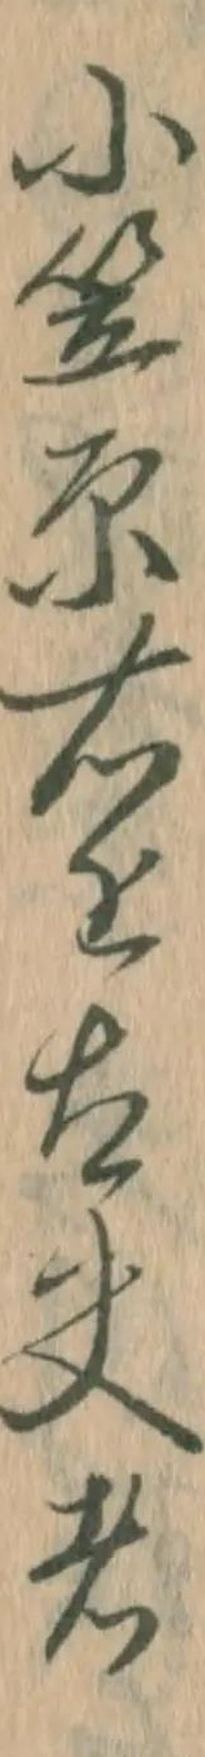小笠原右近太夫者
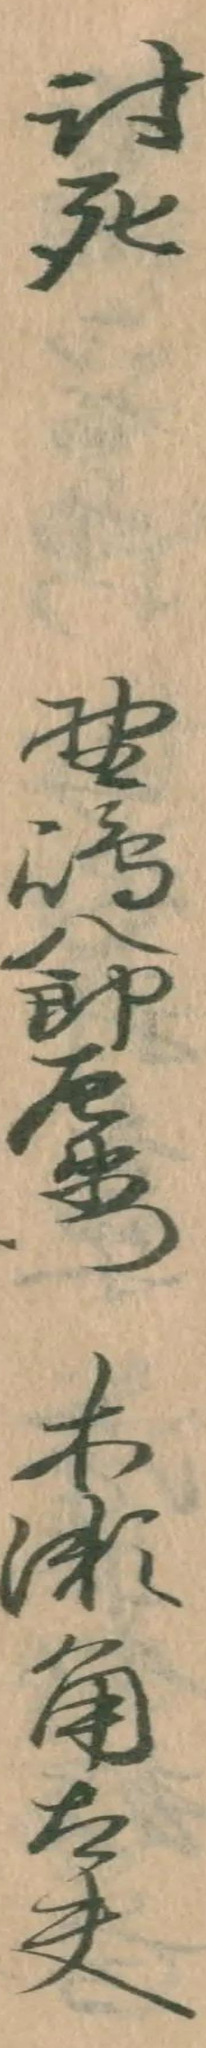討死野島八郎左衛門木瀬角太夫
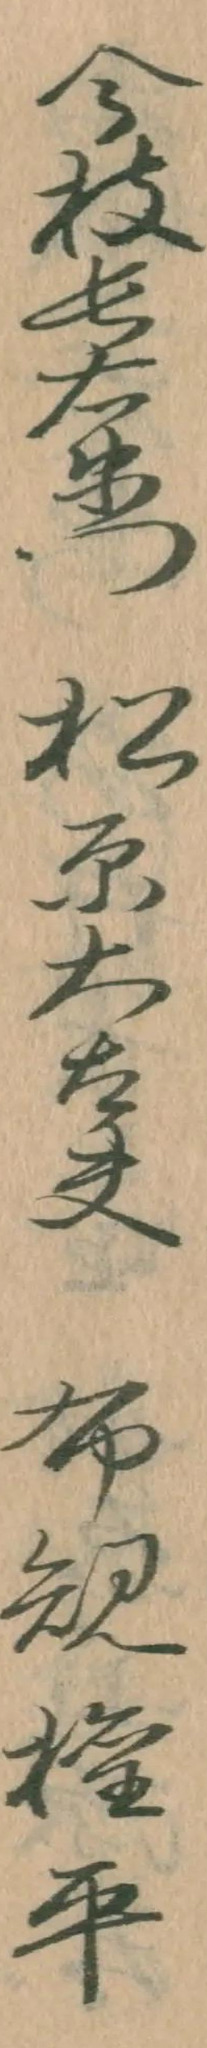今枝長右衛門松原大太夫布規権平
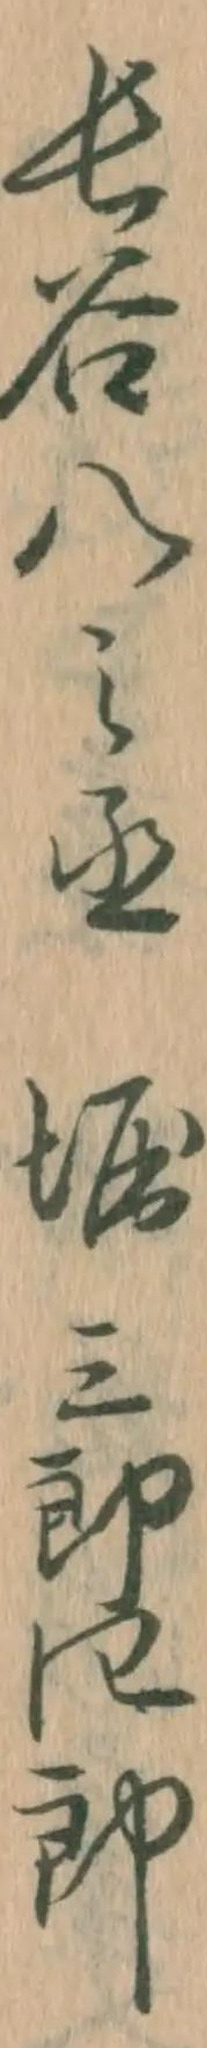長谷八之丞堀三郎四郎
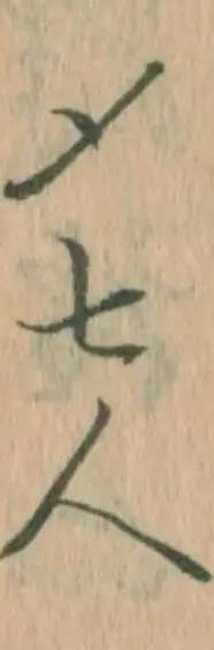〆七人
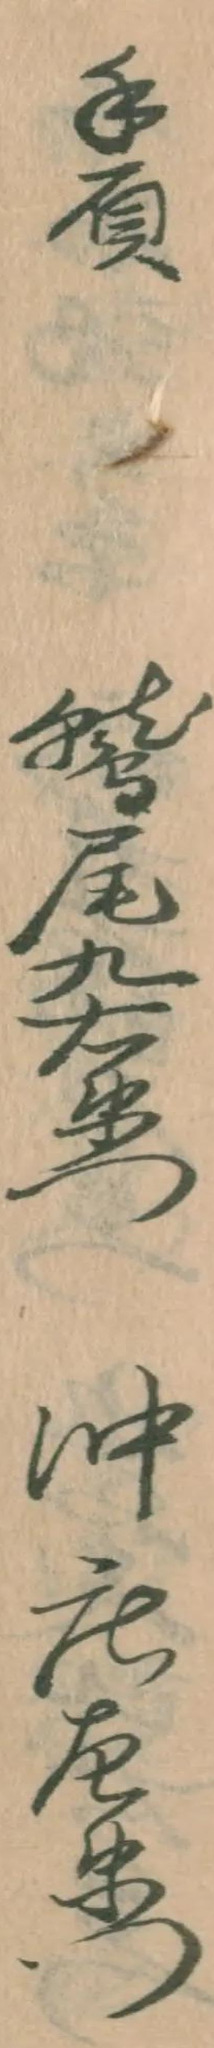手負鷲尾九右衛門沖庄左衛門
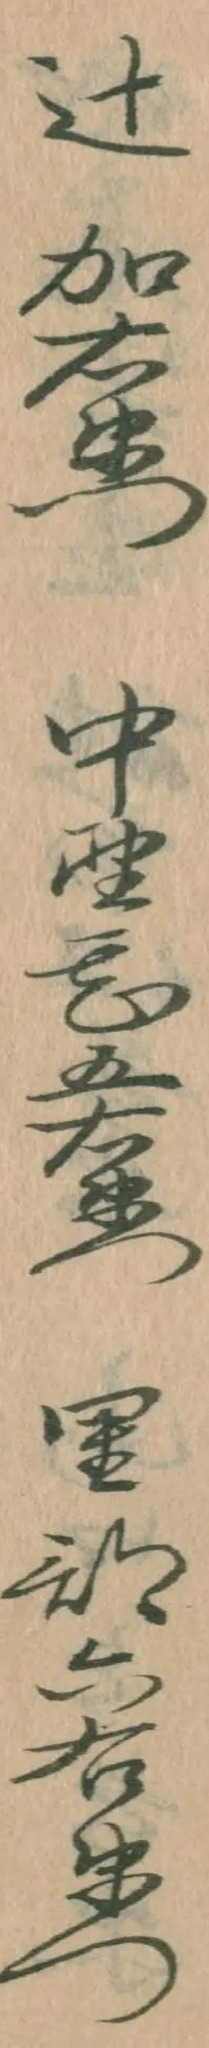辻加右衛門中野甚五右衛門里部六右衛門
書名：切支丹御退治記 49巻. [9]
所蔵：国立国会図書館 National Diet Library, JAPAN
